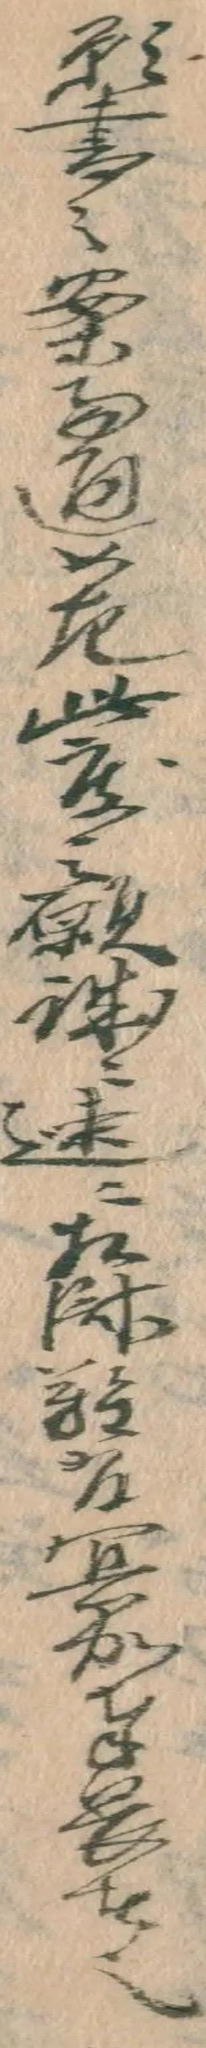願書之案両通如左此度之願誠ニ速ニ相済難有冥加奉畏者也
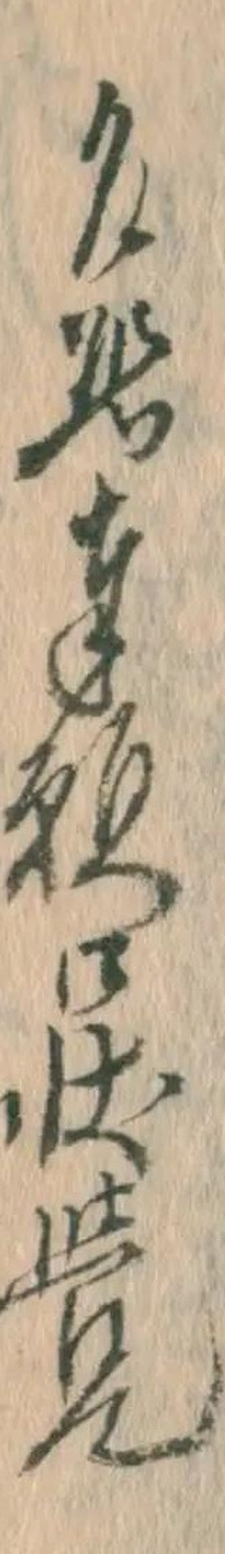乍恐奉願口伏覚
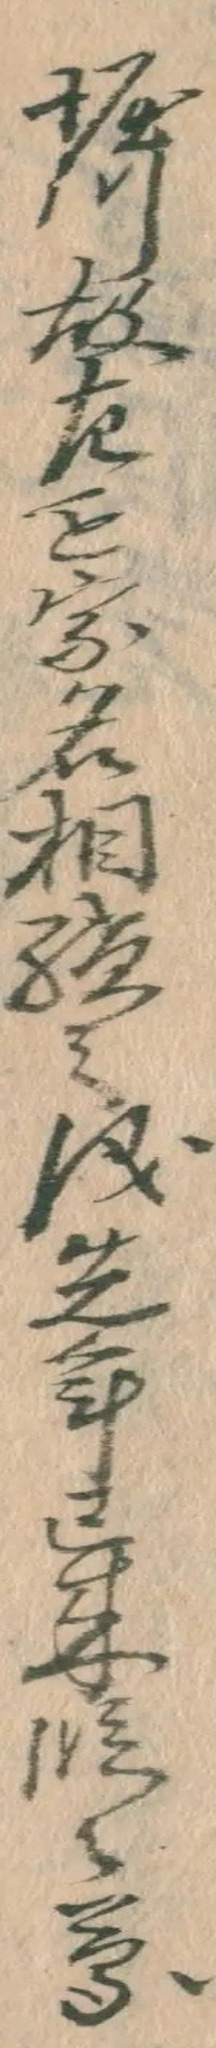一堀川故左近家名相續之儀先年已来段々蒙
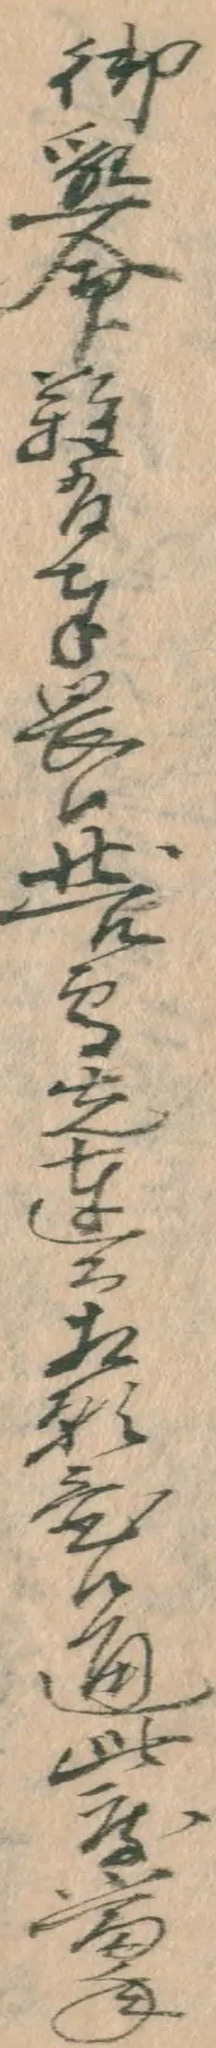御懇命難有奉畏候然候處高先達而相願置候通此度當年
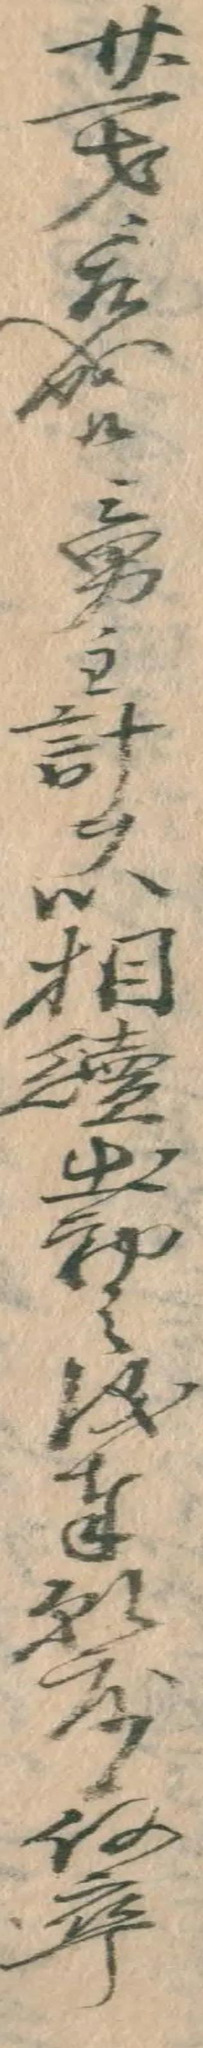廿一才ニ相成ル三男主計ヲ以相續出勤之儀奉願度候何卒
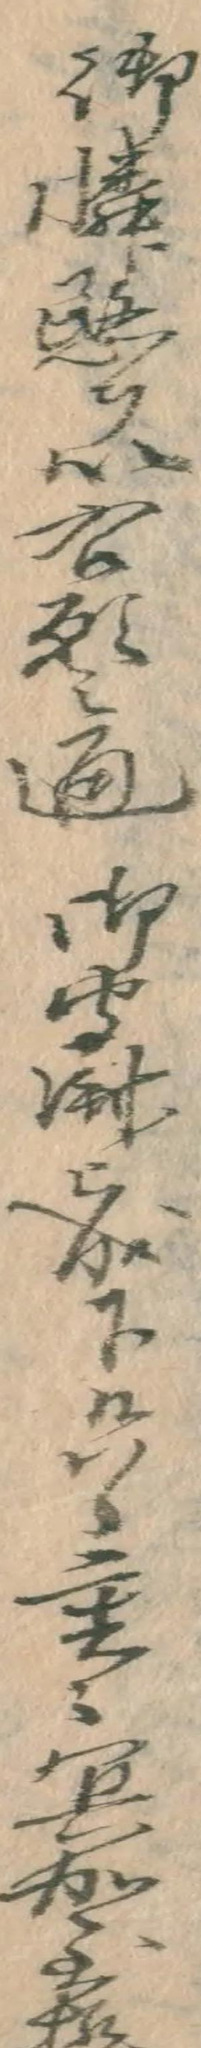御憐愍ヲ以右願之通御聞済被成下候ハヽ重々冥加至極
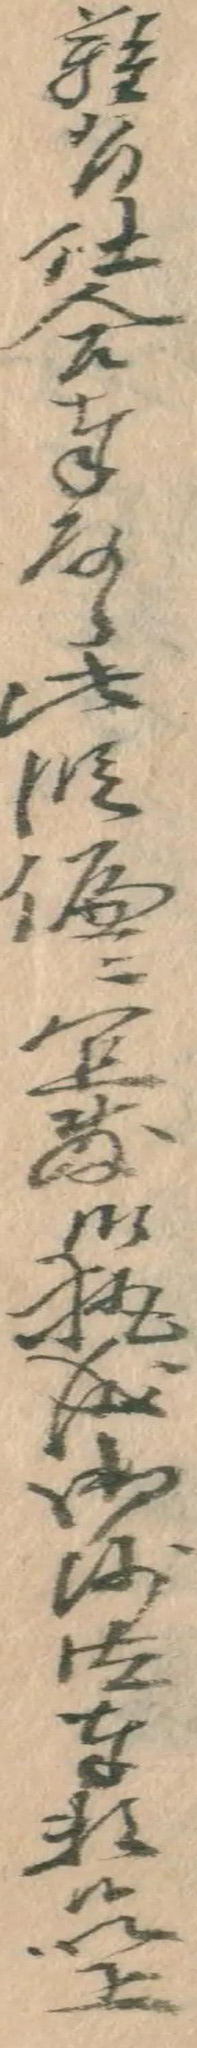難有仕合奉存候此段偏二宜敷御執成御沙汰奉願候以上
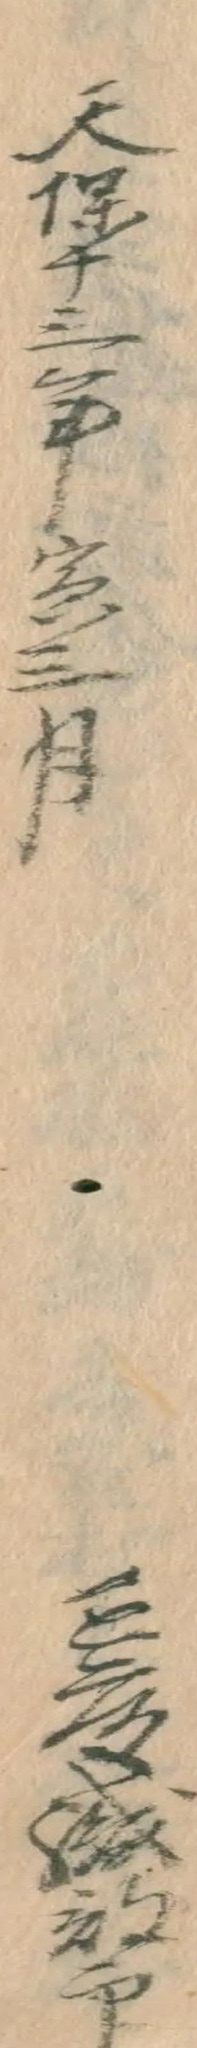天保十三年寅三月近藤織部印

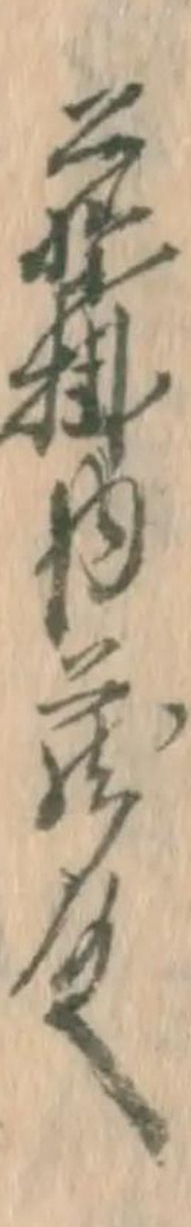藤掛内蔵殿
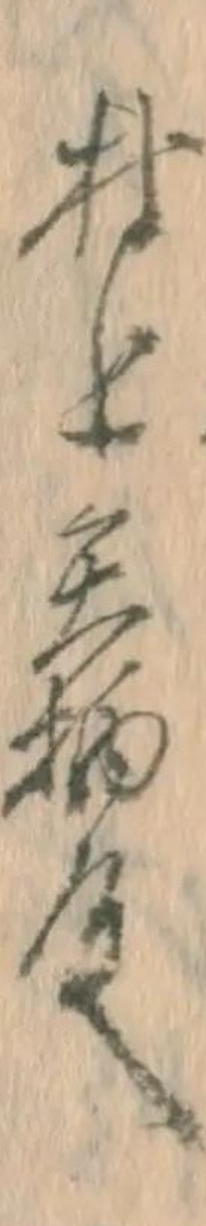村上貞柄殿
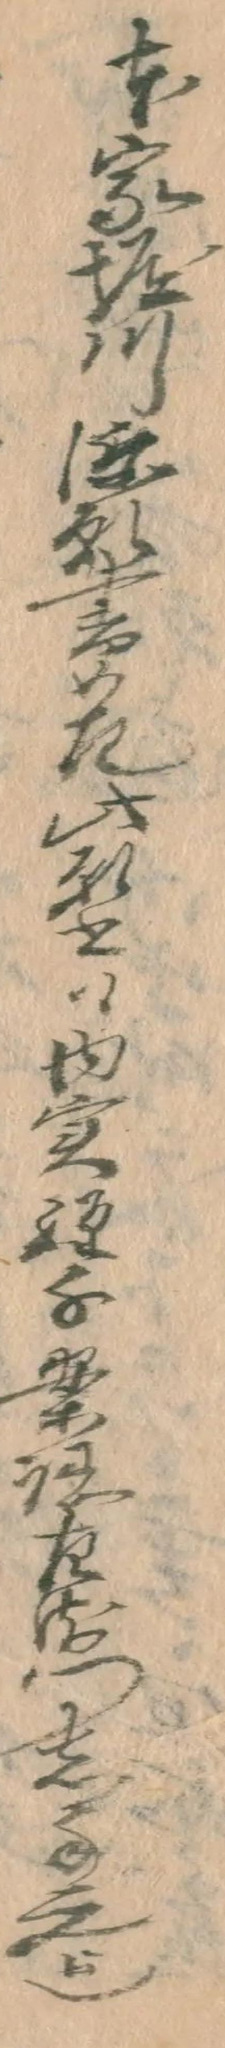本家堀川添願書御左此願書も内実経千案認左衛門志家元迄
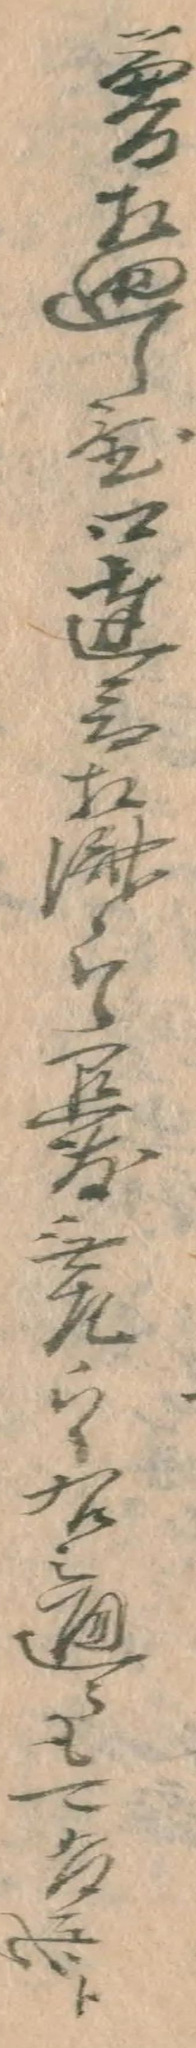兼而相廻し置口達ニ而相済候ハヽ宜敷無差右之通ニも可有之哉ト
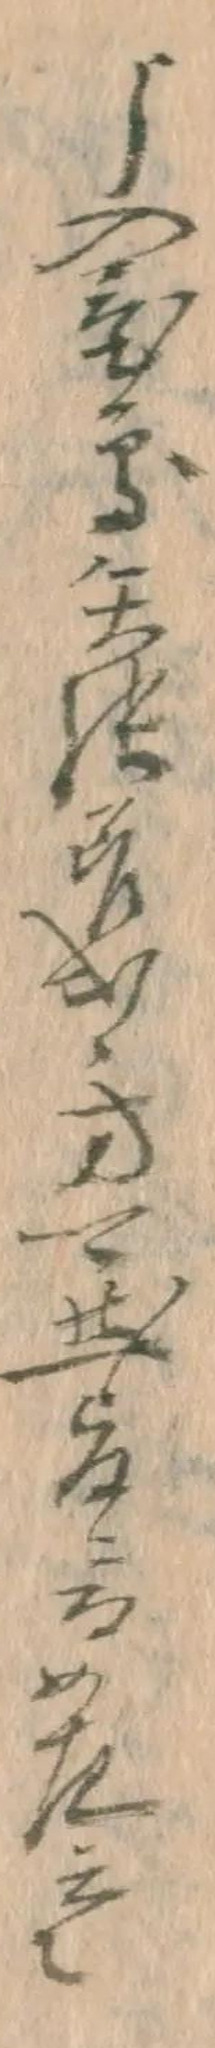申入置處矢張差出候方可然旨ニ而如左之
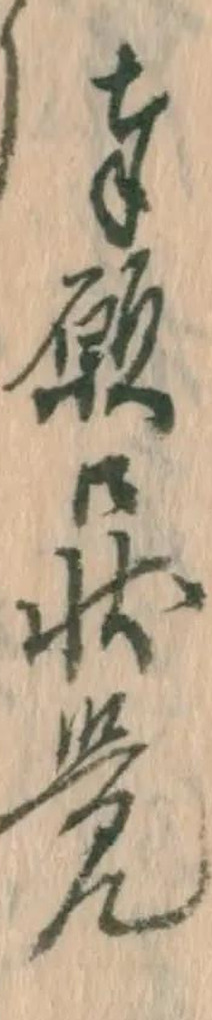奉願口状覚
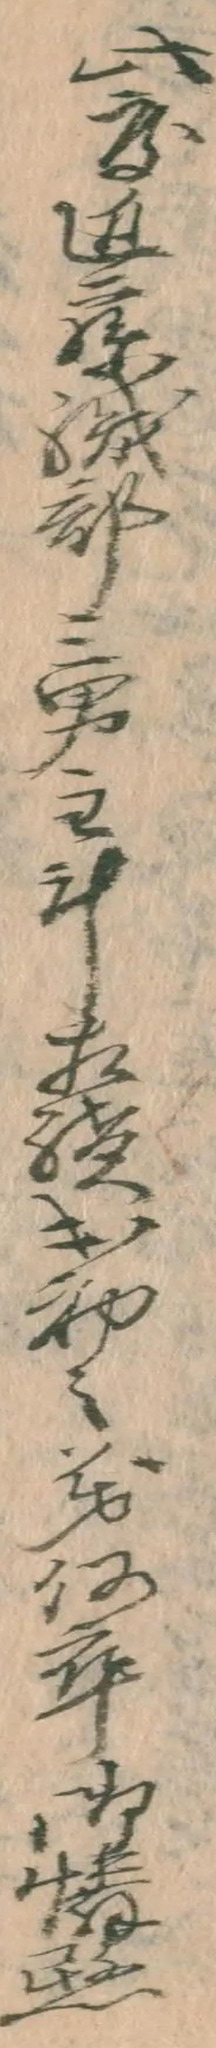此度近藤織部三男主斗相続出勤之義何卒御憐愍
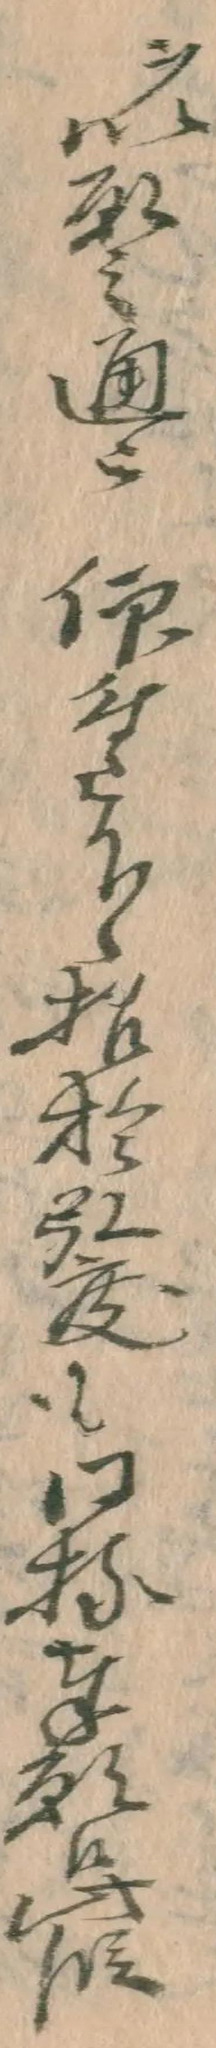ヲ以願之通被仰付被下御招於弘度も同様奉願候此段
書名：賀茂社記録. 第69冊
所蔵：国立国会図書館 National Diet Library, JAPAN
